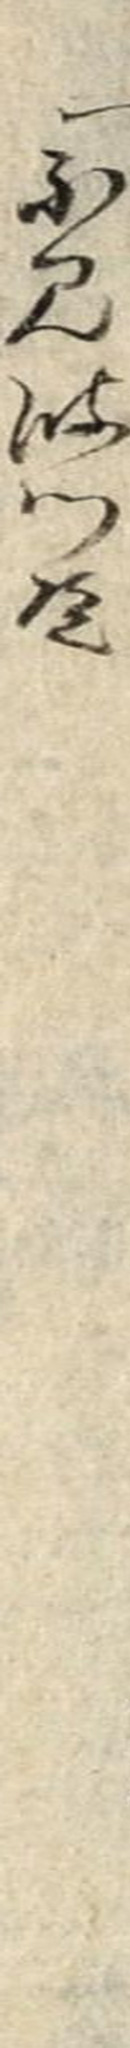永見波門殿
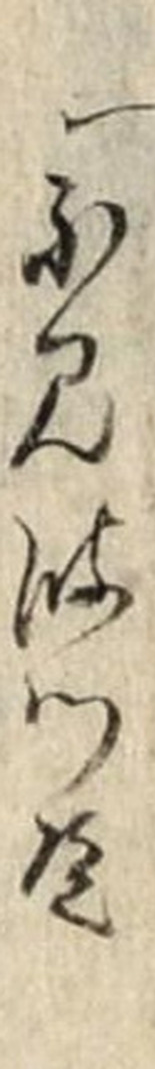永見波門殿
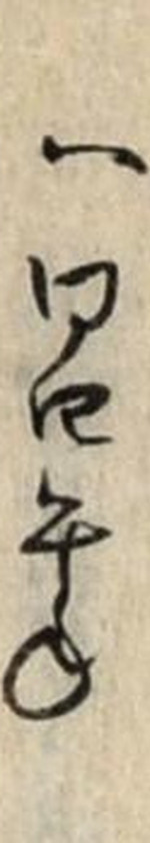一同四午年
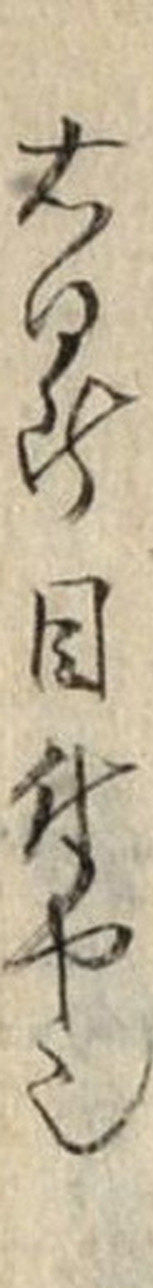右同断目付中也
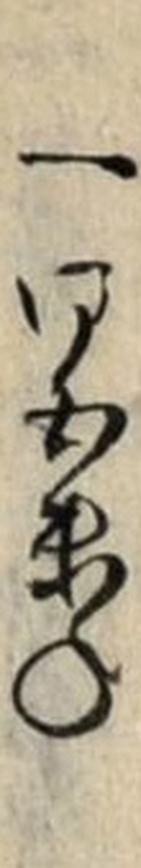一同五未年
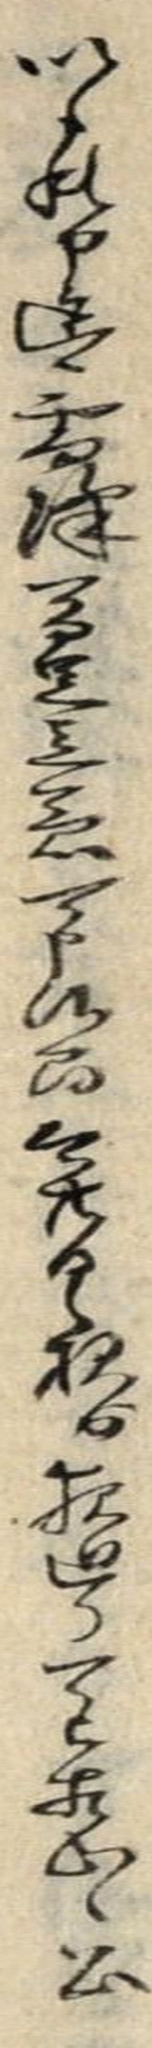以手紙申達候雪深馬足立兼可申候間今廿日夜ゟ夜廻り可被相止候以上

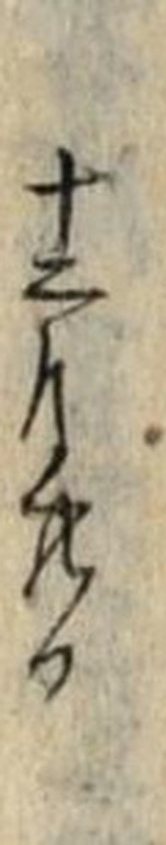十二月廿日
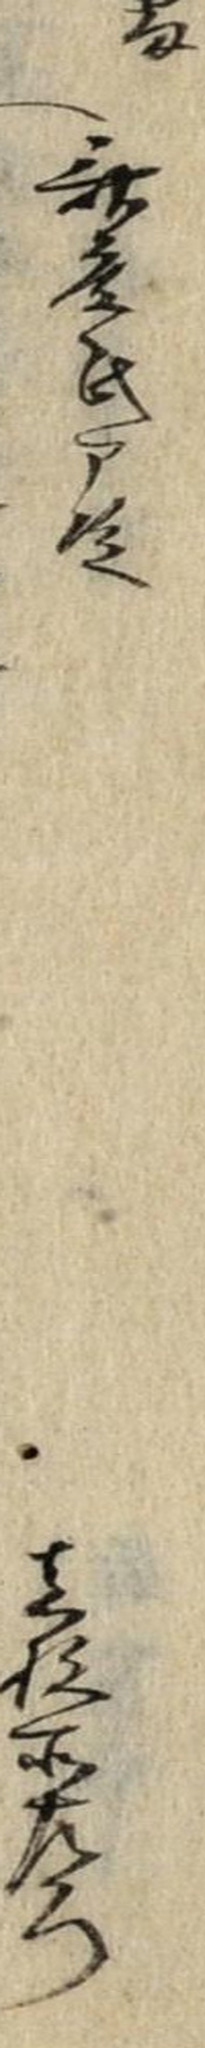月番斉藤民部殿真杉所左衛門
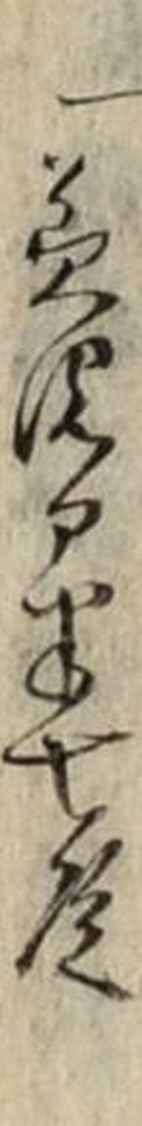美濃部半七殿
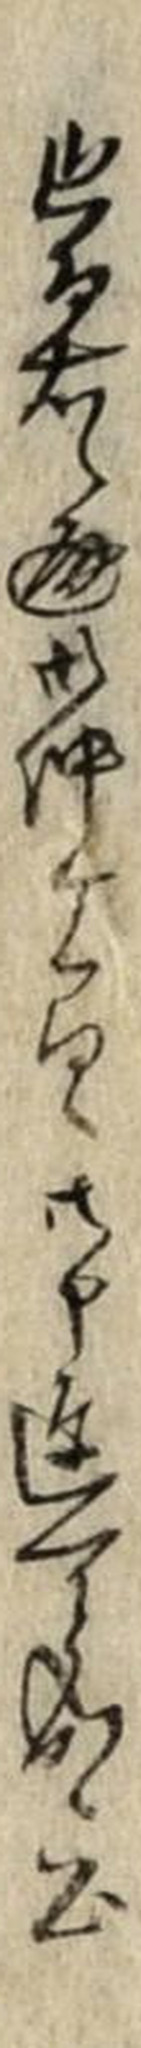追而右之通御仲ヶ間へ御申達可被成候以上
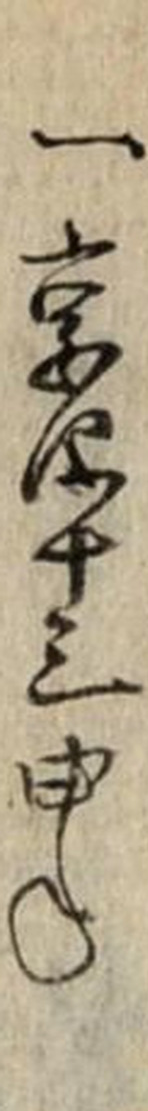一享保十三申年
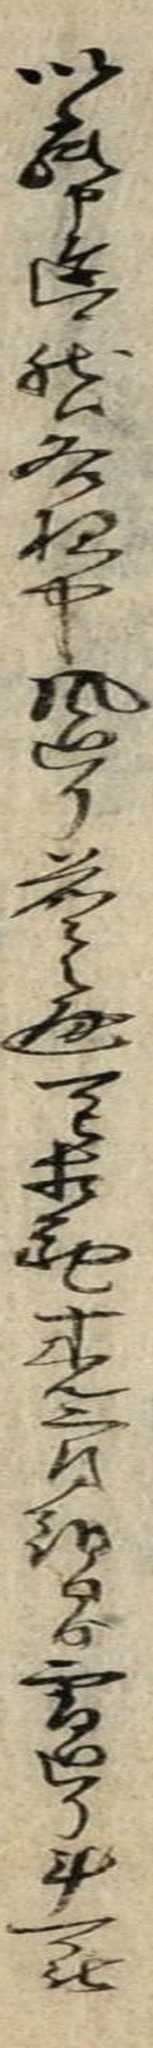以手紙申達候然は各夜中風廻り前々之通可被相勤候来る二月朔日ゟ宵廻り斗可被
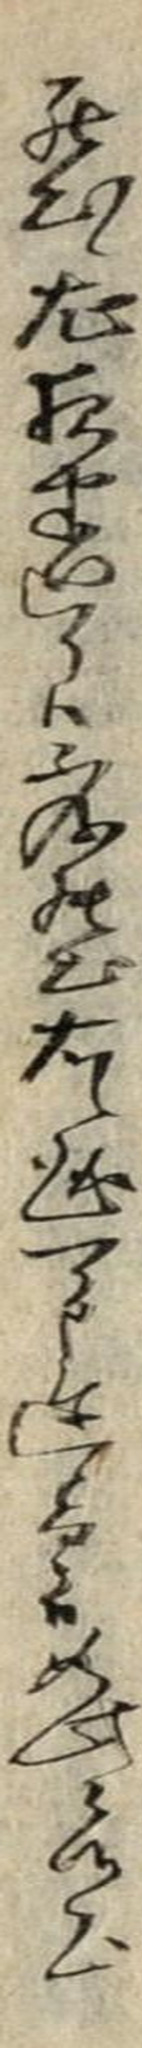罷出候尤夜半廻りは不及罷出右之趣可申達旨に付如此に候以上
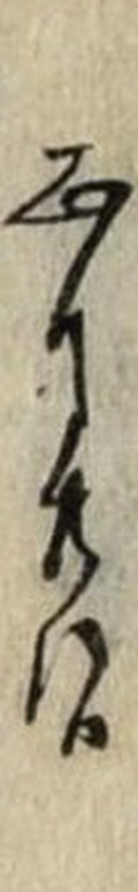正月廿八日
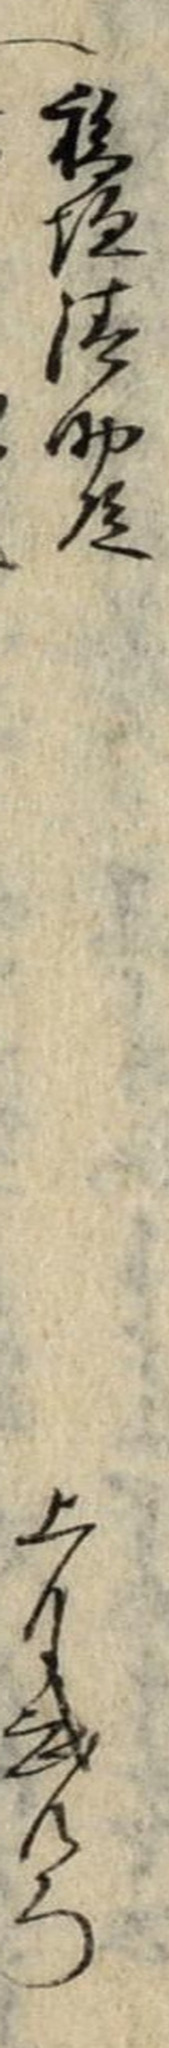稲垣清助殿上月武左衛門
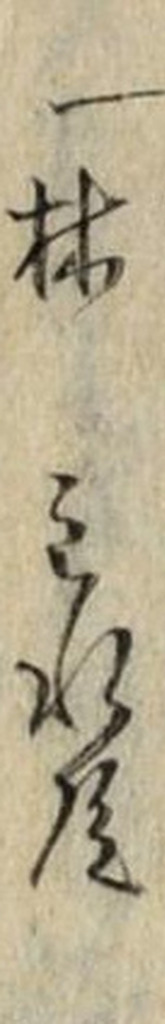林主水殿
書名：蒐輯之部
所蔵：福井県文書館 Fukui Prefectural Archives
